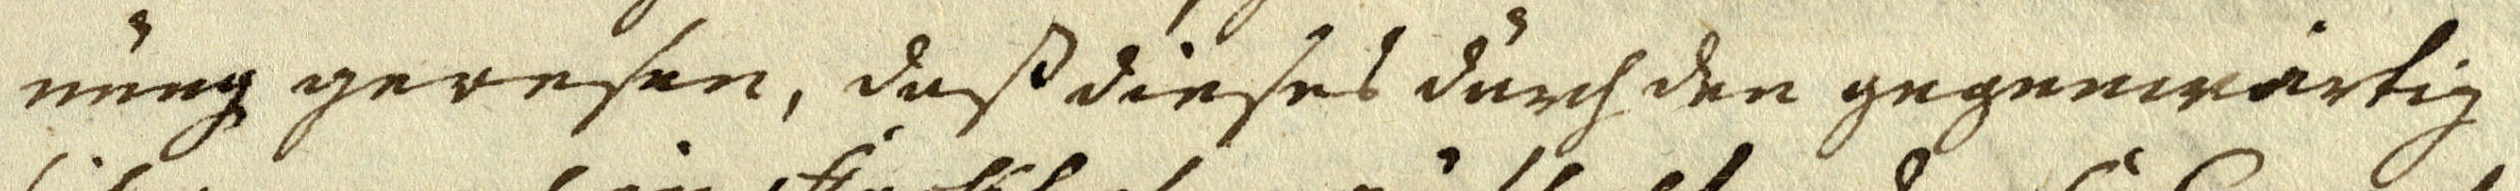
nung gewesen, daß dieses durch den gegenwärtig
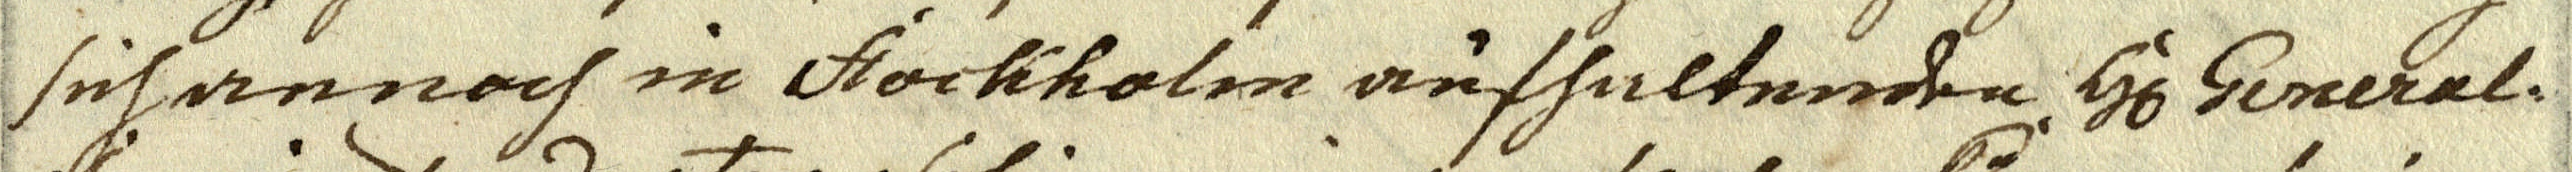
sich annoch in Stockholm aufhaltenden H. General¬
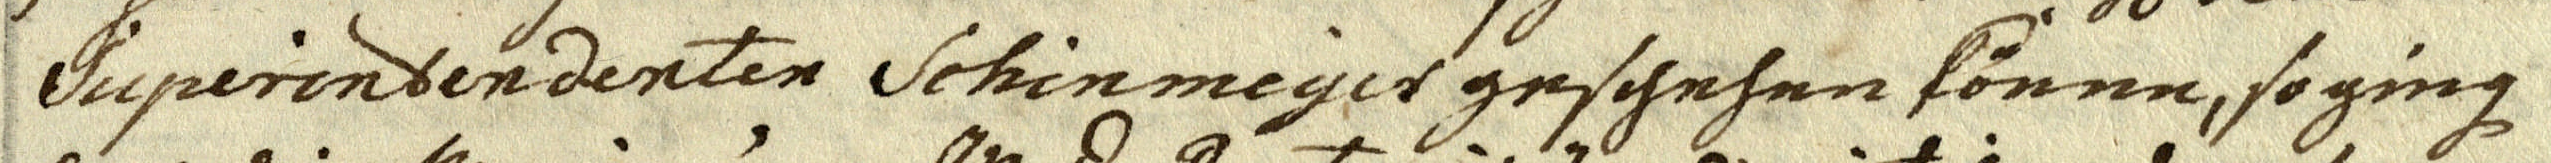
Superintendenten Schinmeÿer geschehen könne, so ging
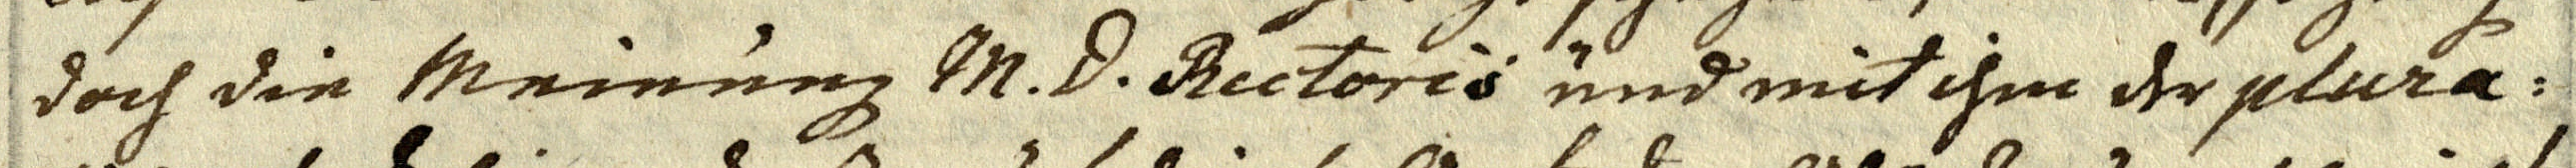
doch die Meinung M. D. Rectoris und mit ihm der plura¬
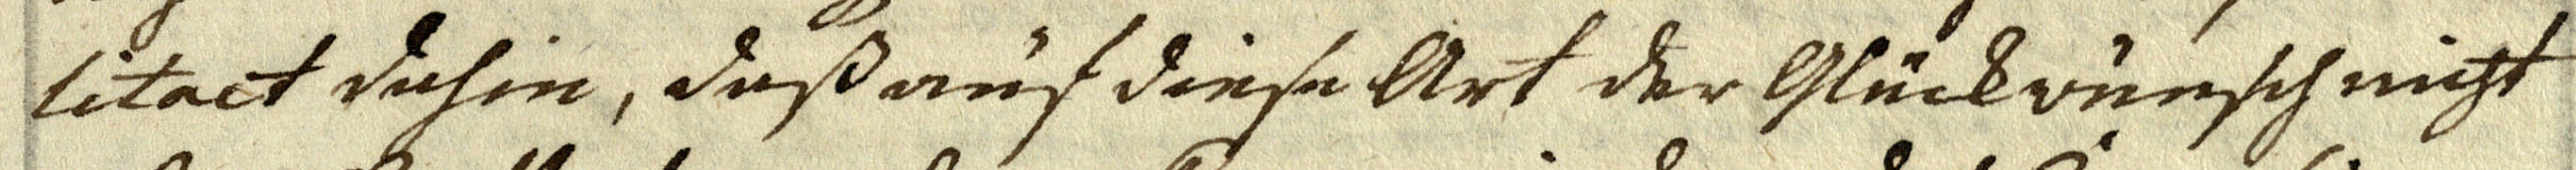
litaet dahin, daß auf diese Art der Glückwunsch nicht
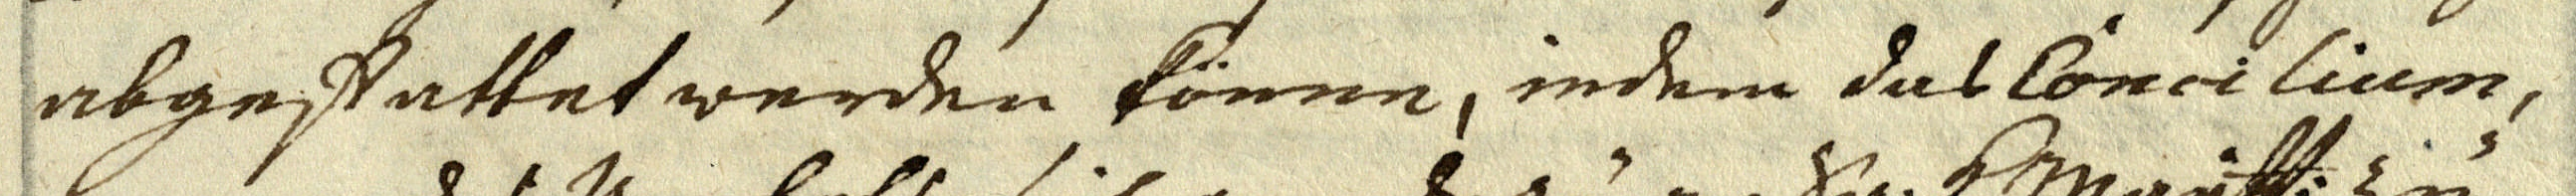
abgestattet werden könne, indem das Concilium,
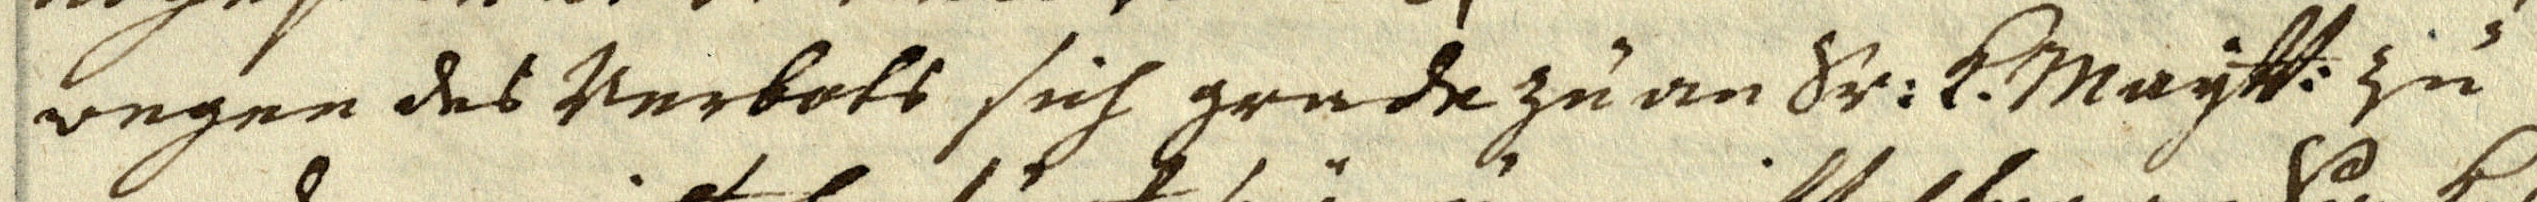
wegen des Verbots sich gradezu an Sr. K. Maÿtt. zu
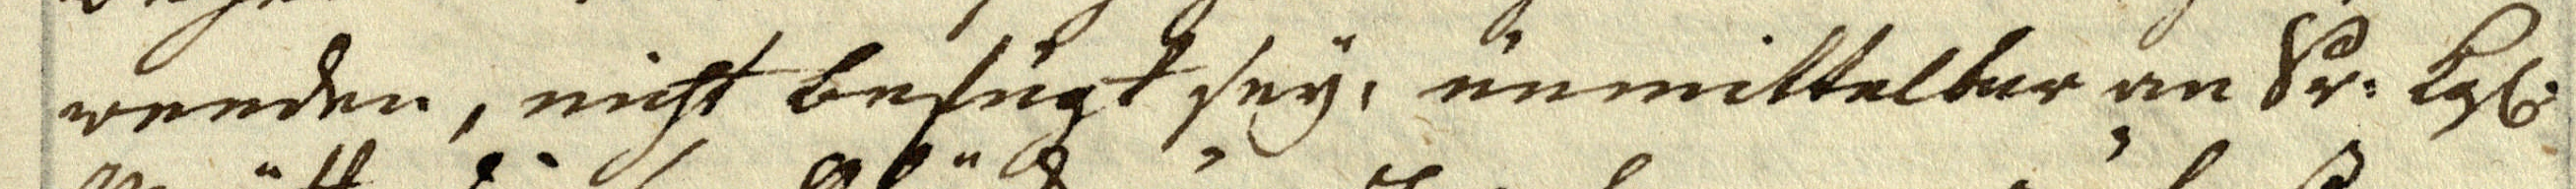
wenden, nicht befugt seÿ, unmittelbar an Sr. Kgl.
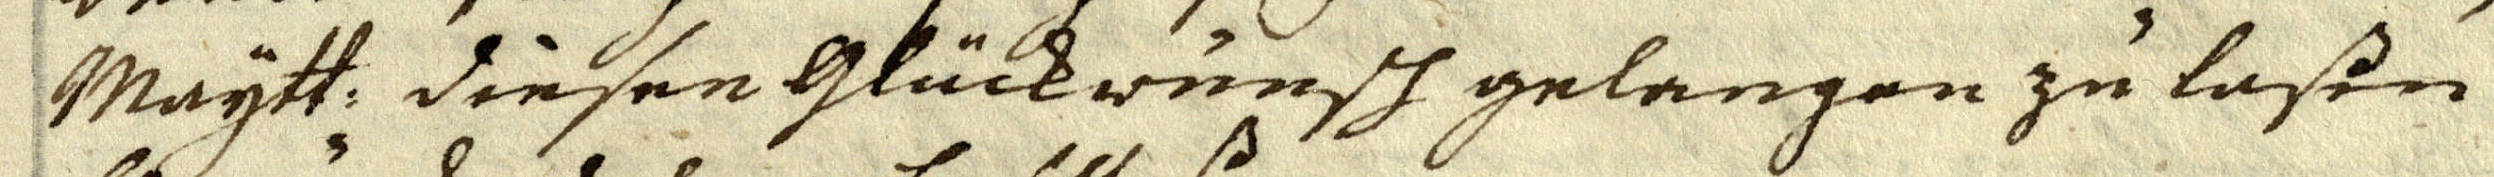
Maÿtt. diesen Glückwunsch gelangen zu laßen.
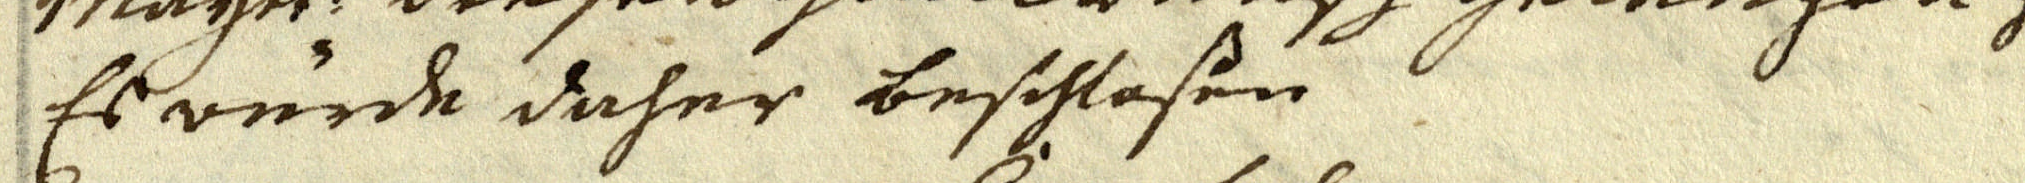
Es wurde daher beschloßen
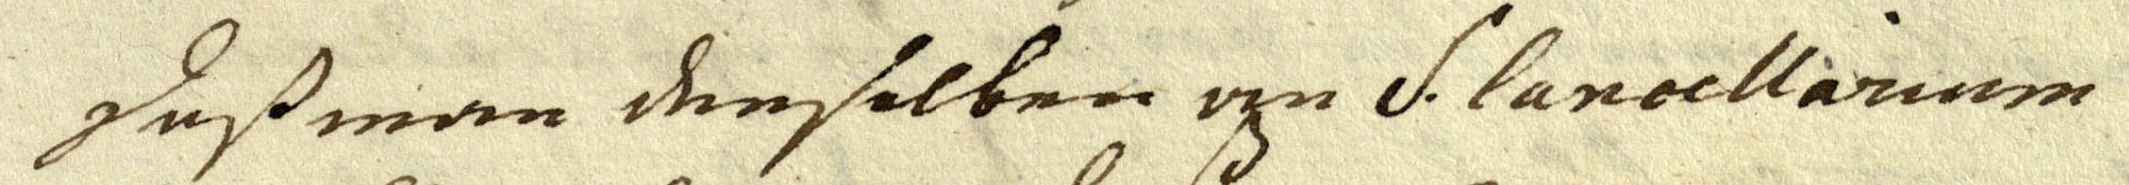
Daß man denselben an S. Cancellarium
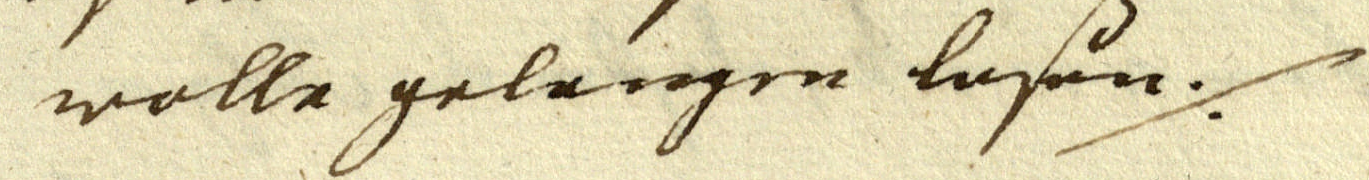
wolle gelangen laßen.
